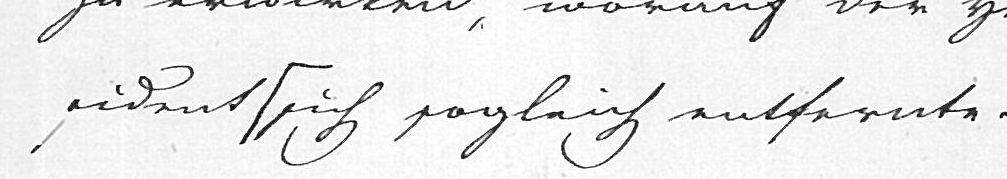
sident sich sogleich entfernte.
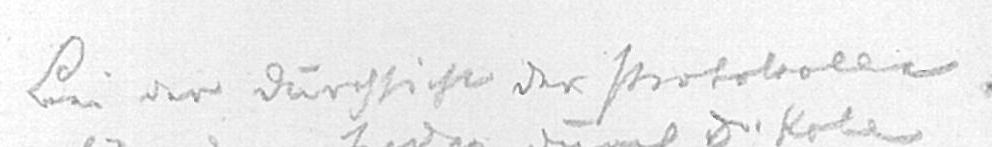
Bei der Durchsicht der Protokolle
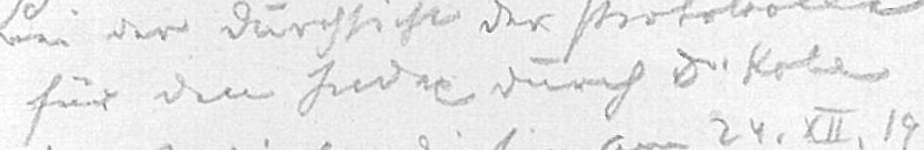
für den Index durch Dr Kohl
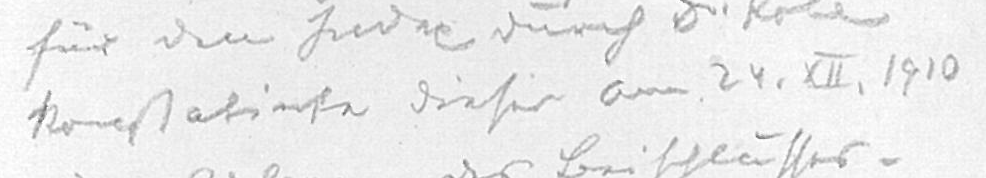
konstatierte dieser am 24. XII. 1910
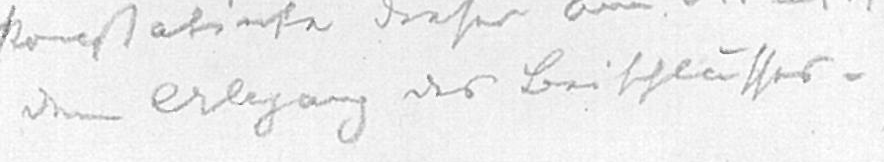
den Abgang des Beischlusses.
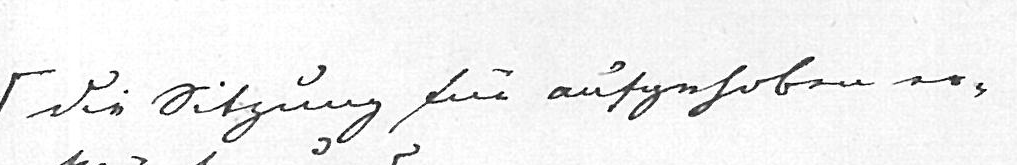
die Sitzung für ausgehoben er-
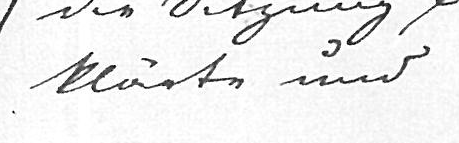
klärte und
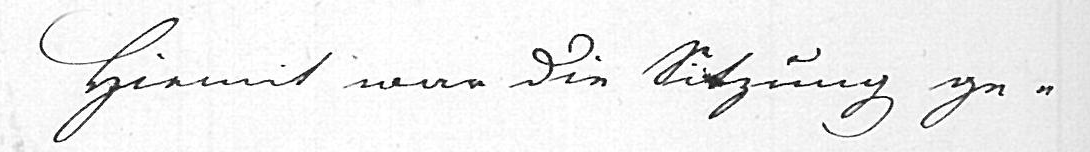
Hiemit war die Sitzung ge-
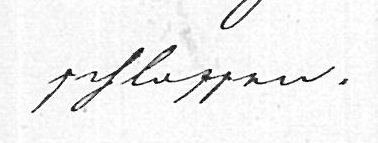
schlossen.
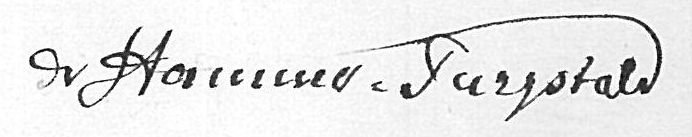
Dr Hammer-Purgstall
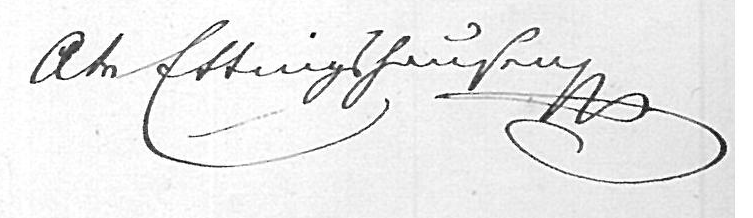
AvEttingshausen
